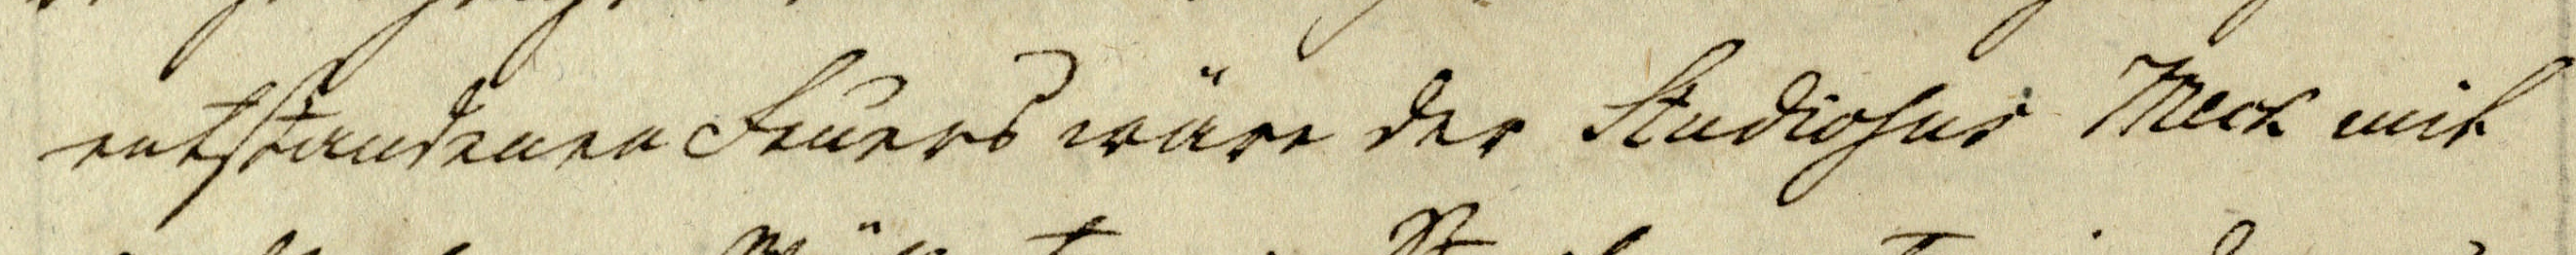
entstandenen Feuers wäre der Studiosus Meck mit
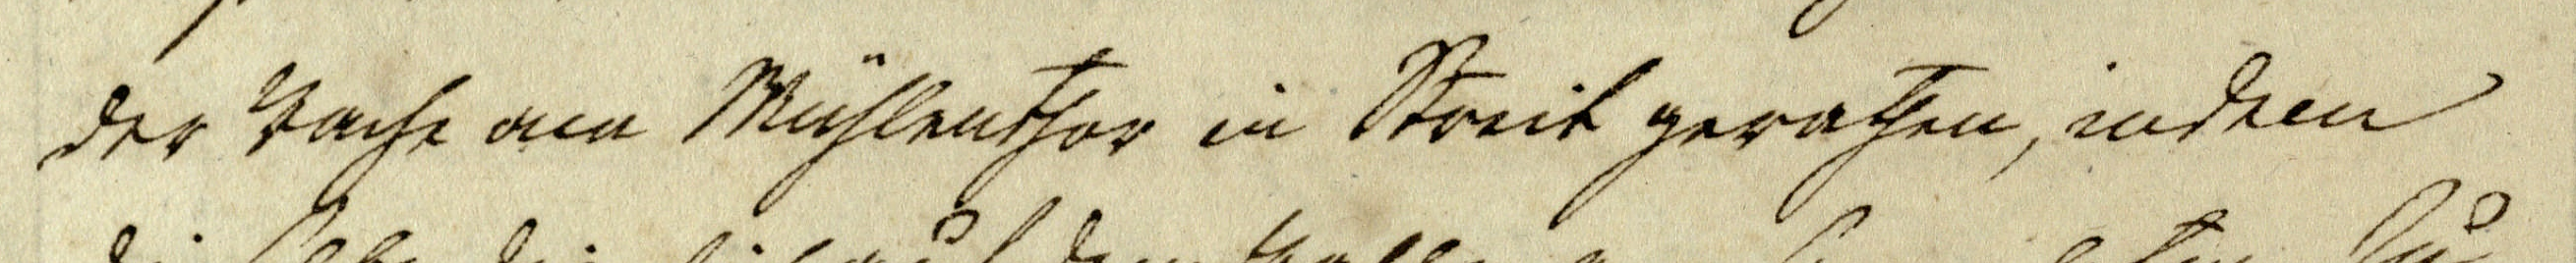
der Wache am Mühlenthor in Streit gerathen, indem
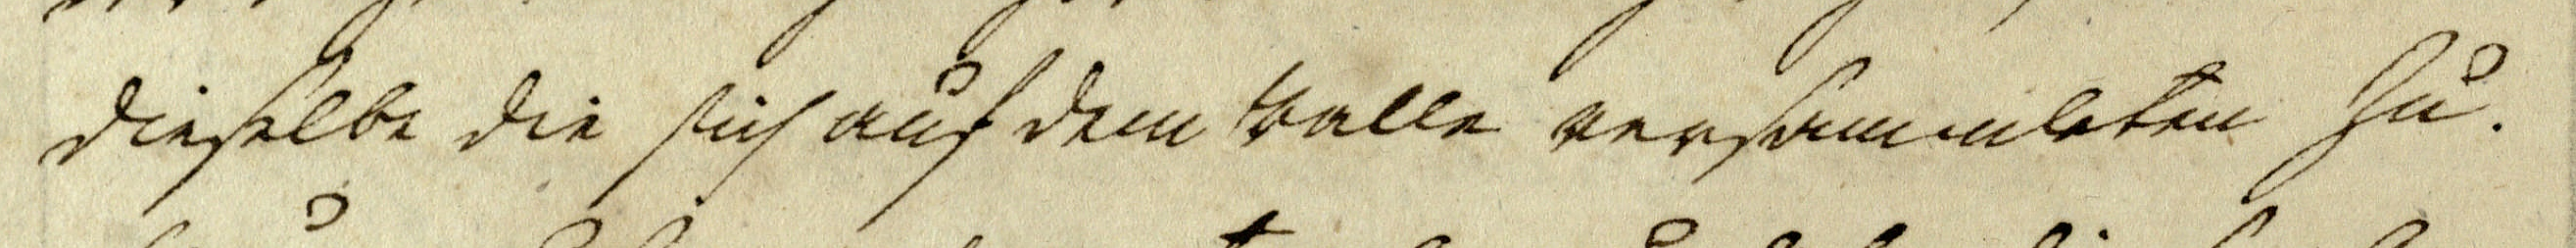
dieselbe die sich auf dem Walle versammleten Zu¬
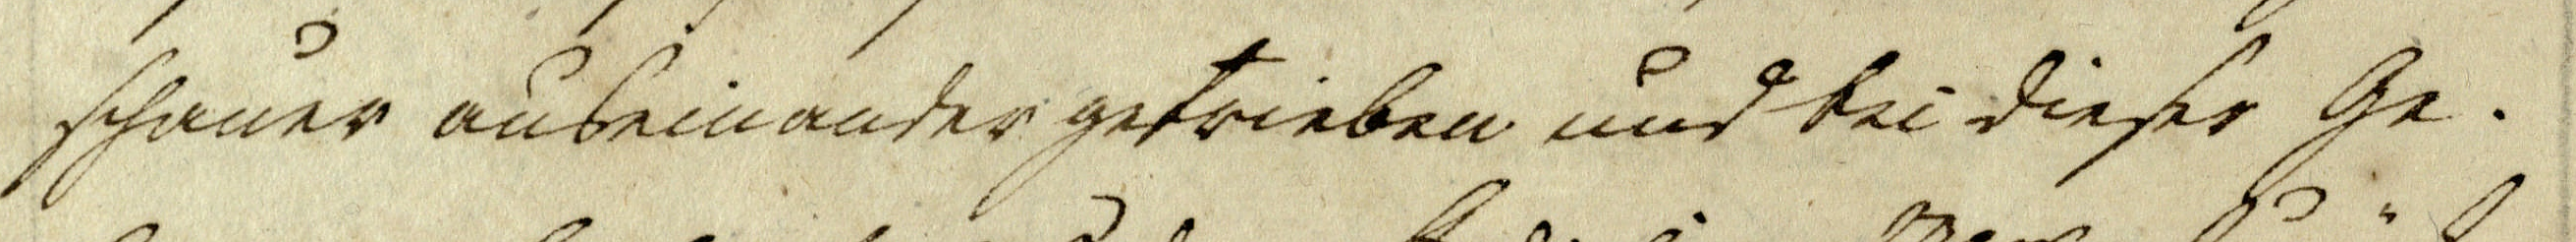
schauer auseinander getrieben und bei dieser Ge¬
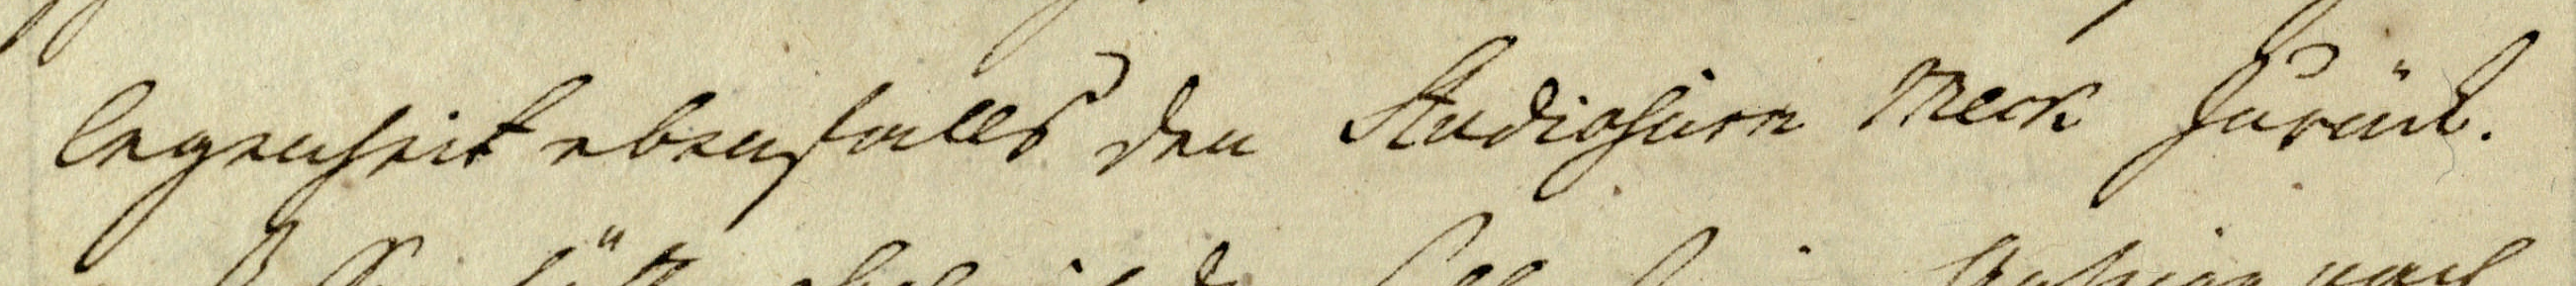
legenheit ebenfalls den Studiosum Meck zurück¬
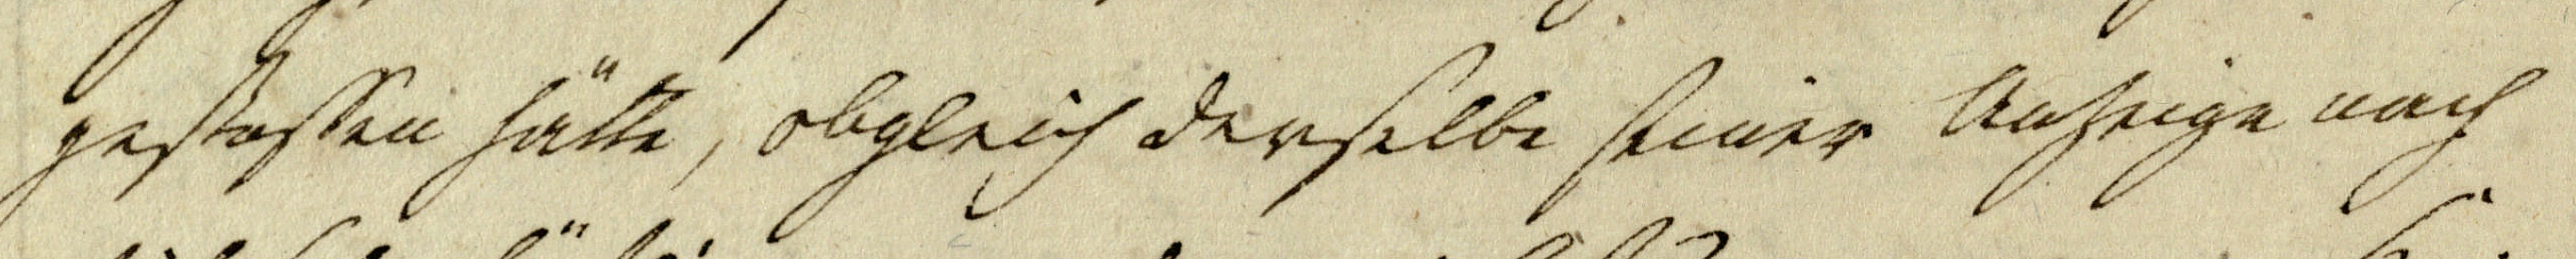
gestossen hätte, obgleich derselbe seiner Anzeige nach
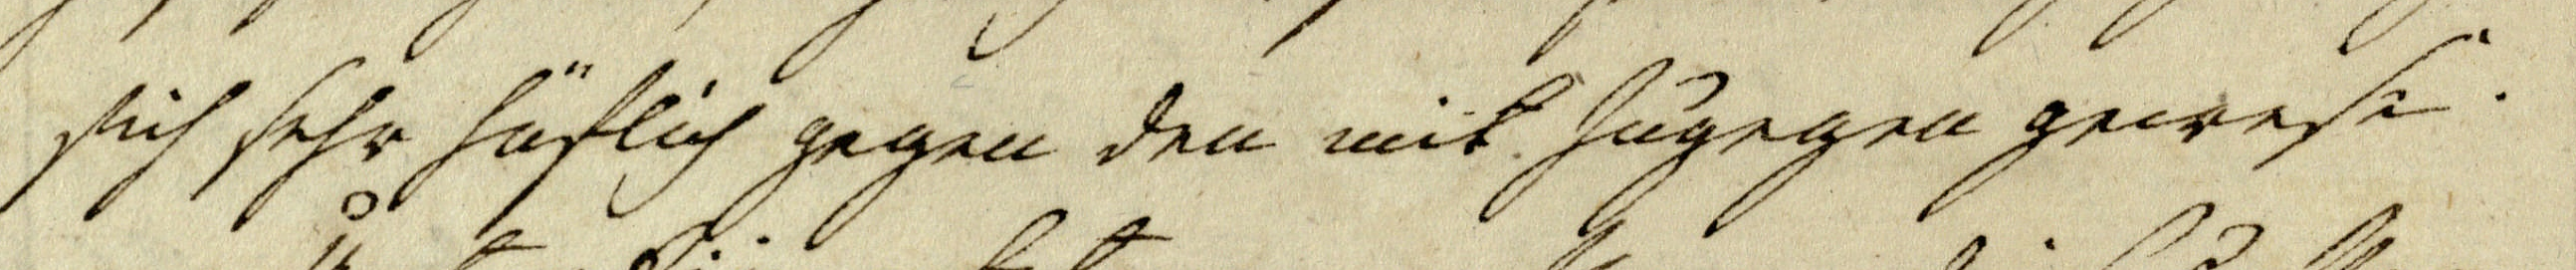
sich sehr höflich gegen den mit zugegen gewese¬
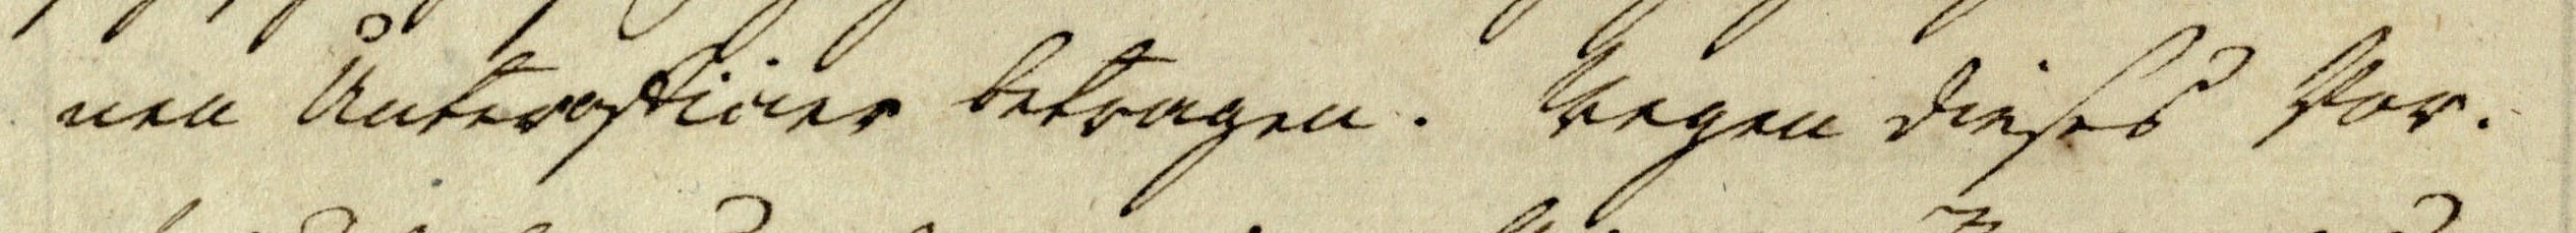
nen Unterofficier betragen. Wegen dieses Vor¬
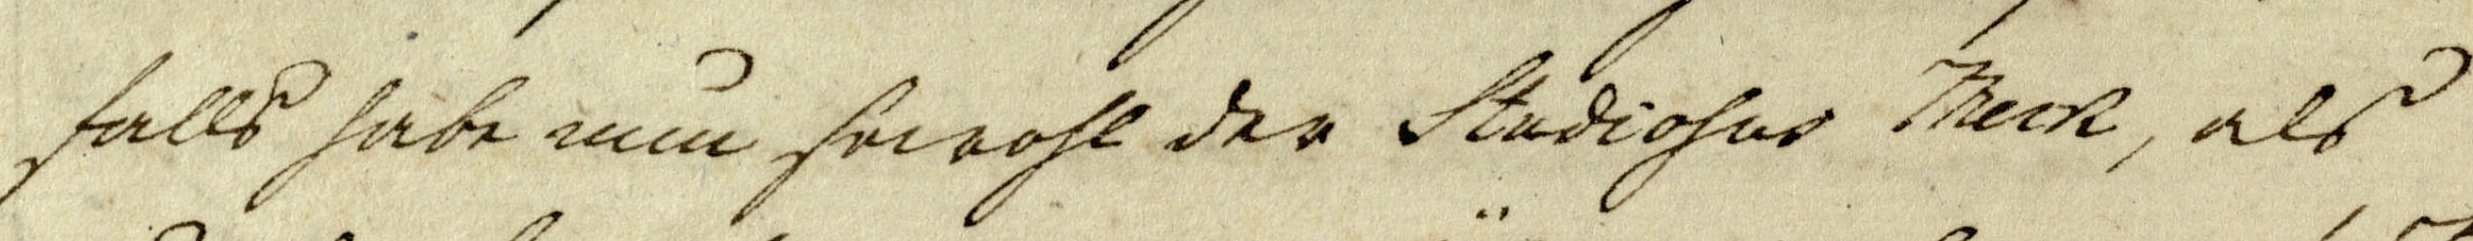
falls habe nun sowohl der Studiosus Meck, als
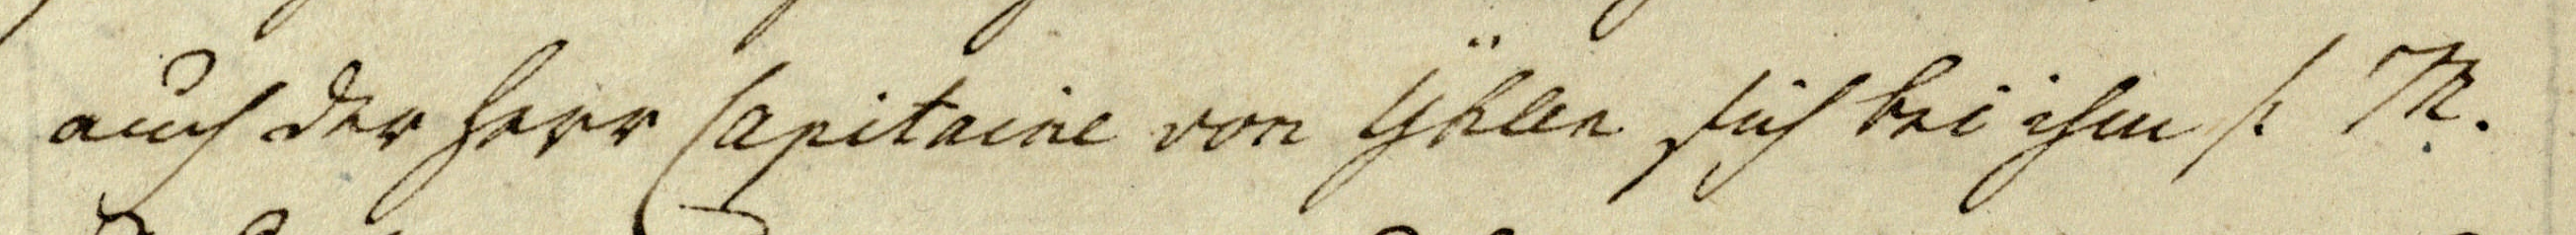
auch der Herr Capitaine von Ÿhlen sich bei ihm /: M.
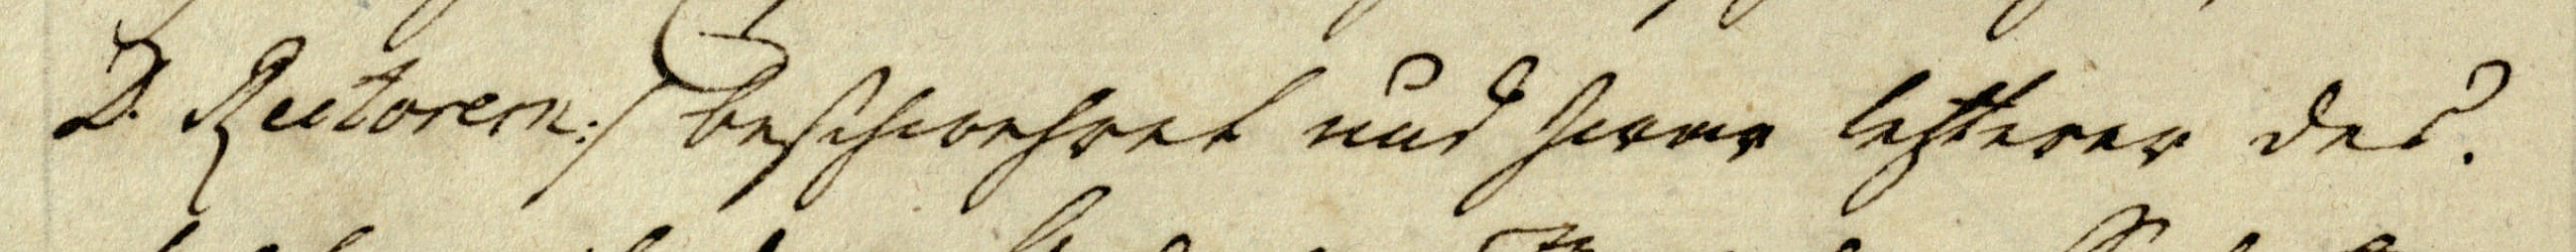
D. Rectore :/ beschwehret und zwar letzterer des¬
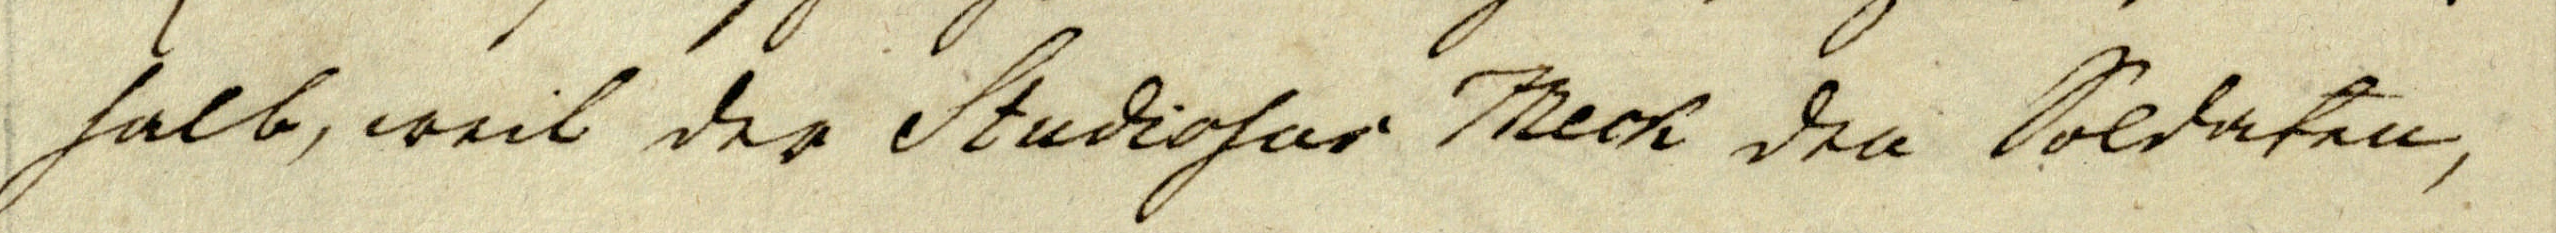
halb, weil der Studiosus Meck den Soldaten,
